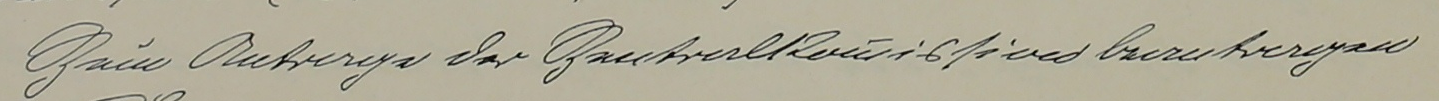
Zum Antrag der Zentralkommission beantragen
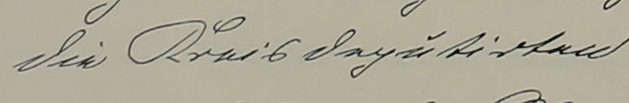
die Kreisdeputirten
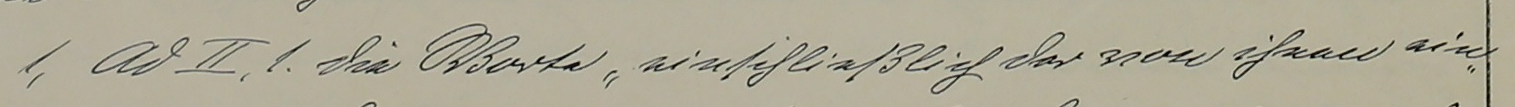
1. Ad II,1. die Worte „einschließlich der von ihnen ein-
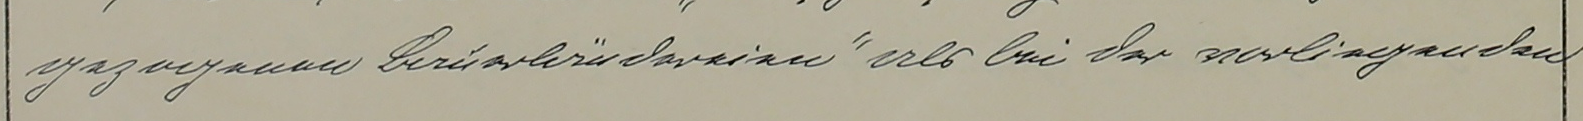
gezogenen Bauerländereien“ als bei der vorliegenden
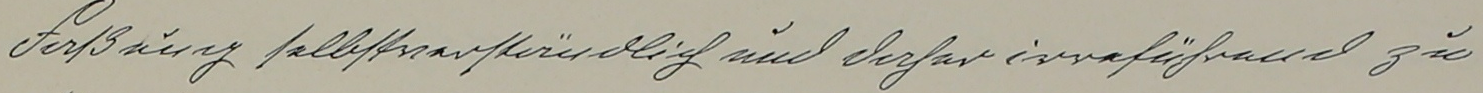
Faßung selbstverständlich und daher irreführend zu
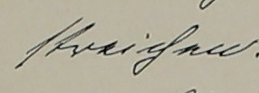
streichen.
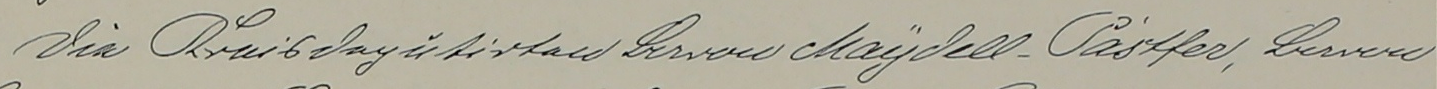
Die Kreisdeputirten Baron Maydell-Pastfer, Baron
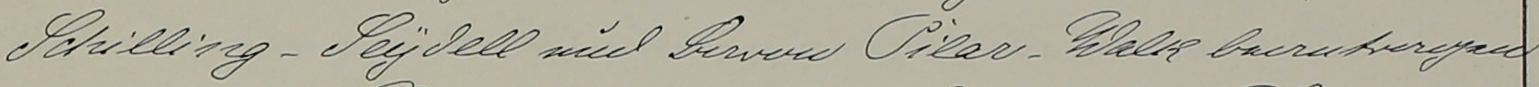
Schilling-Seydell und Baron Pilar-Walk beantragen
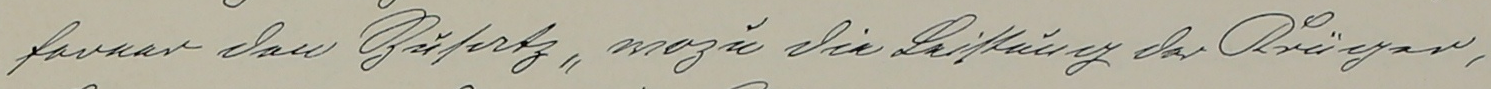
ferner, den Zusatz „wozu die Leistung der Krüger,
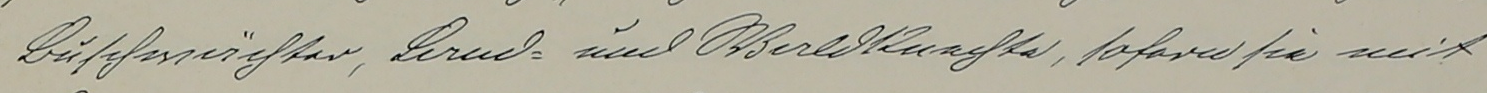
Buschwächter, Land- und Waldknechte, sofern sie mit
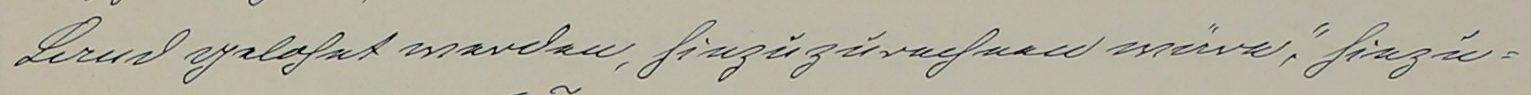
Land gelohnt werden, hinzuzurechnen wäre,“ hinzu-
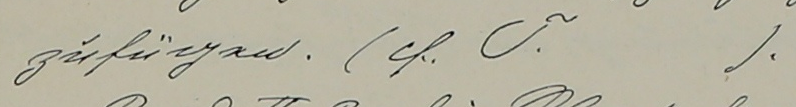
zufügen. (cf. T. ).
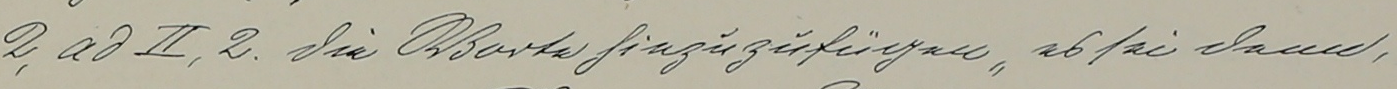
2. ad II,2. die Worte hinzuzufügen „es sei denn,
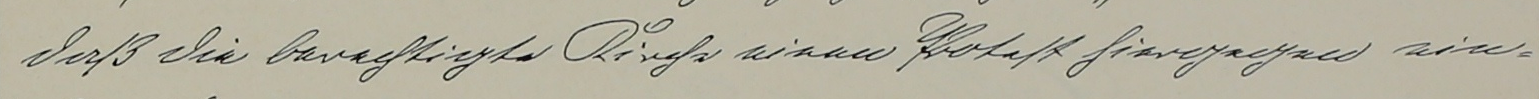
daß die berechtigte Kirche einen Protest hiergegen ein-
